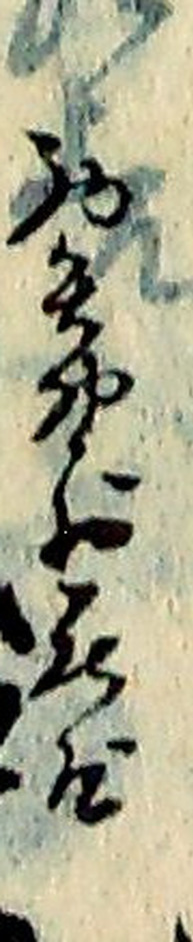西矢野村庄屋
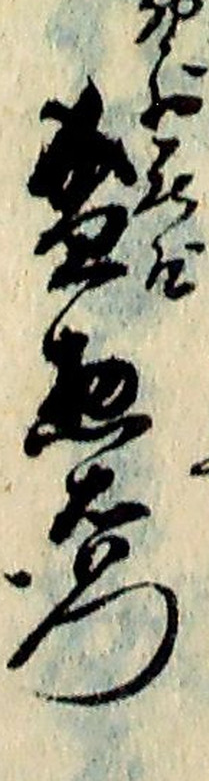盛惣右衛門
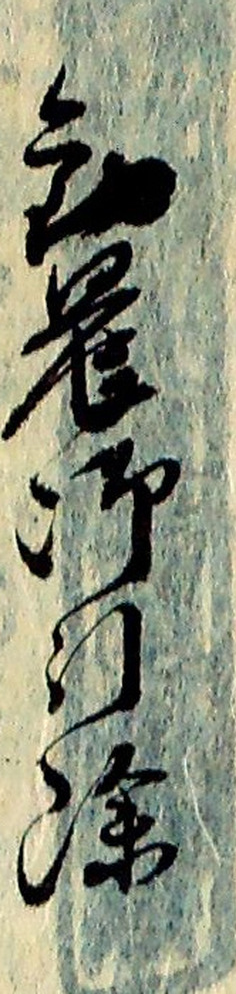勧農御引除
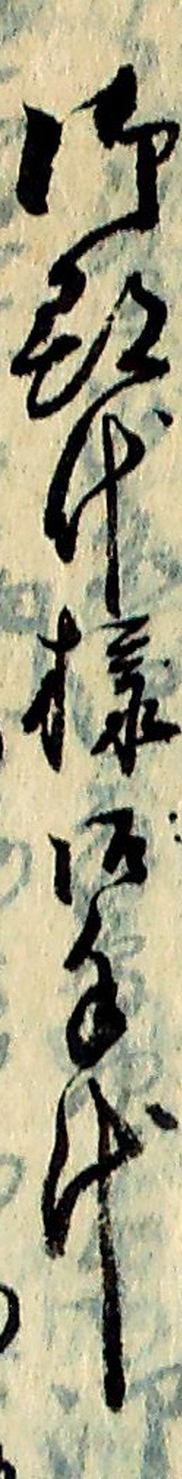御郡代様御手代
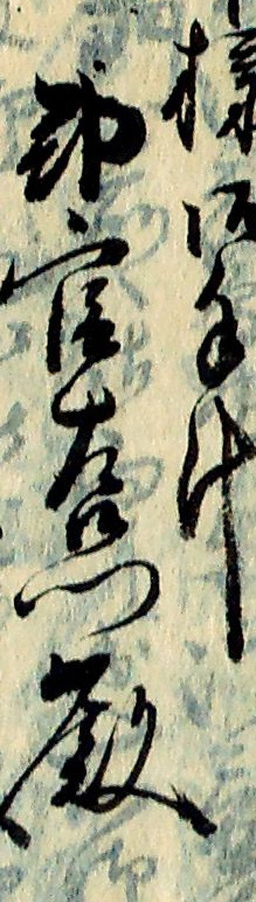郡官左衛門殿
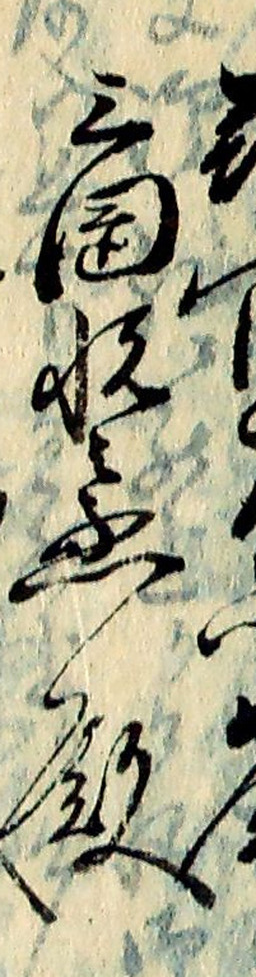三岡悦之丞殿
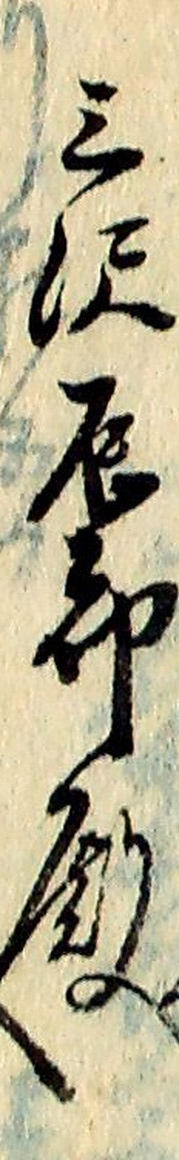三沢辰郎殿
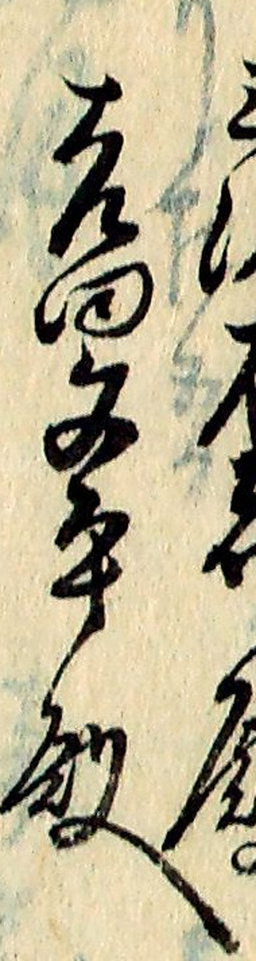吉田文平殿
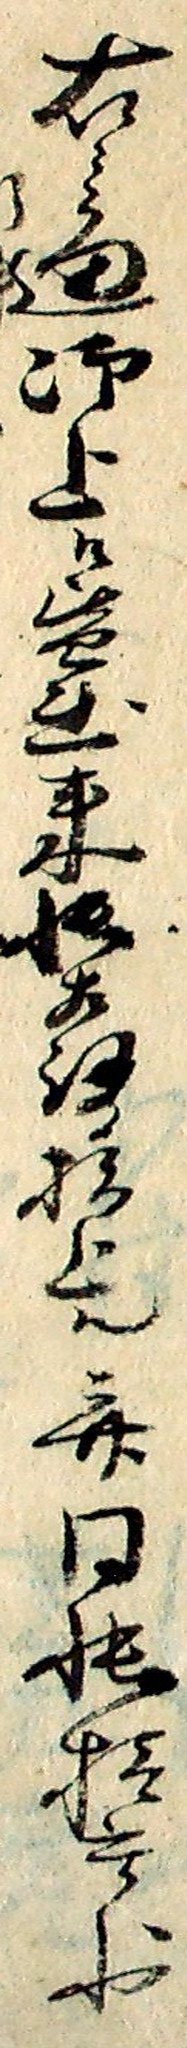右之通御上候皆出来帳相認め指上る并同帳拾六ヶ村

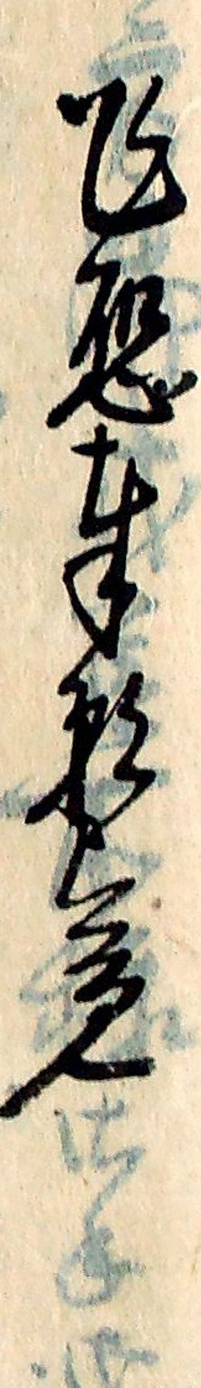乍恐奉願上覚
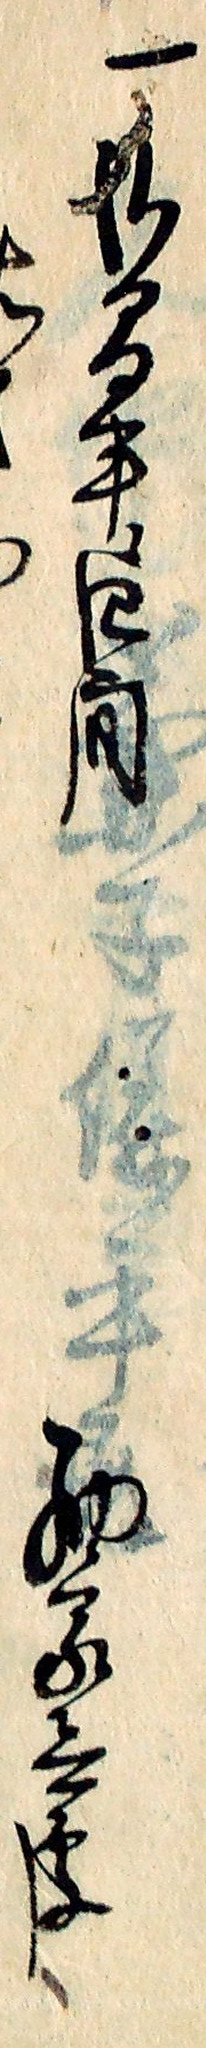一弐間半に四間西家壱処
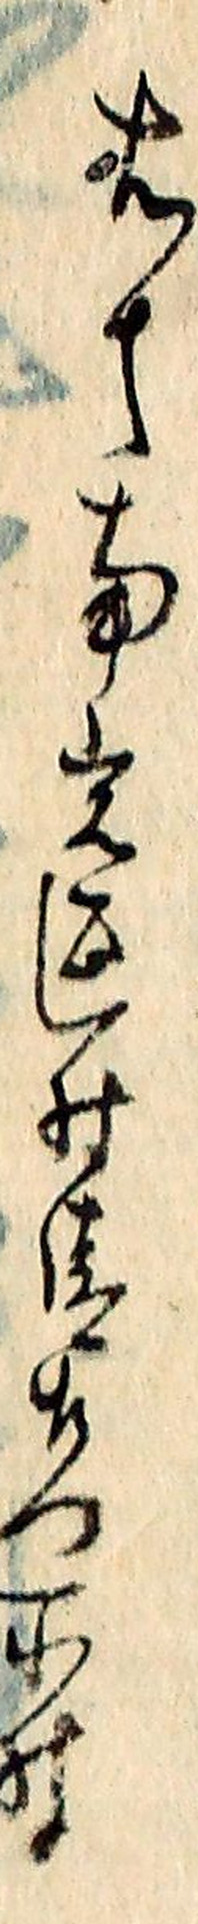右は南岩延村清左衛門所持
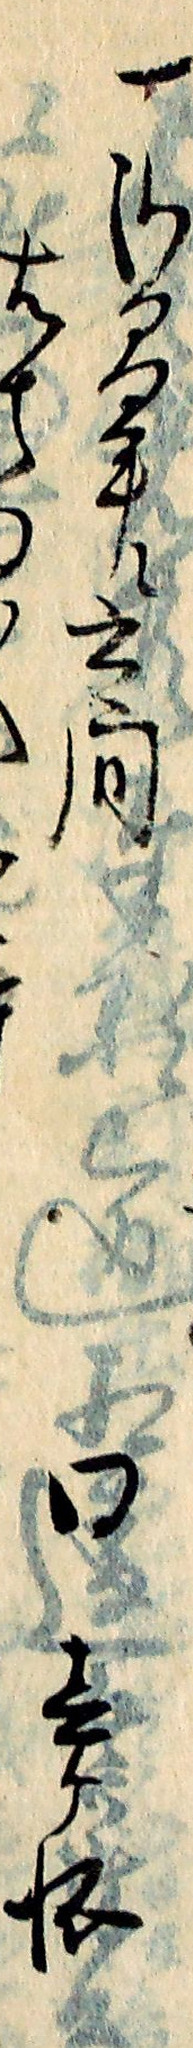一弐間半に六間同壱ヶ所
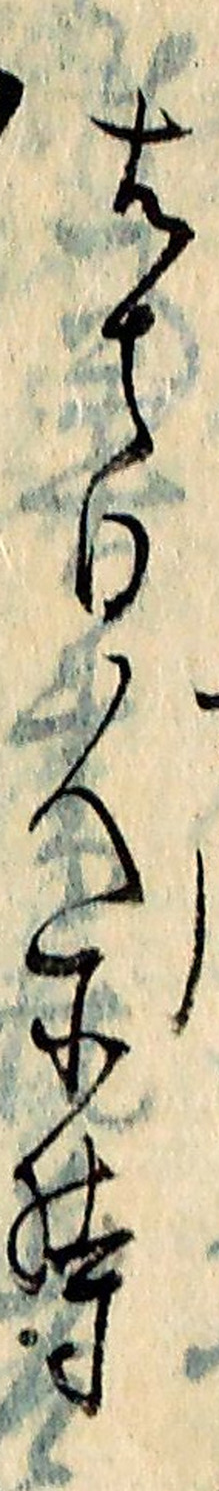右は同人所持
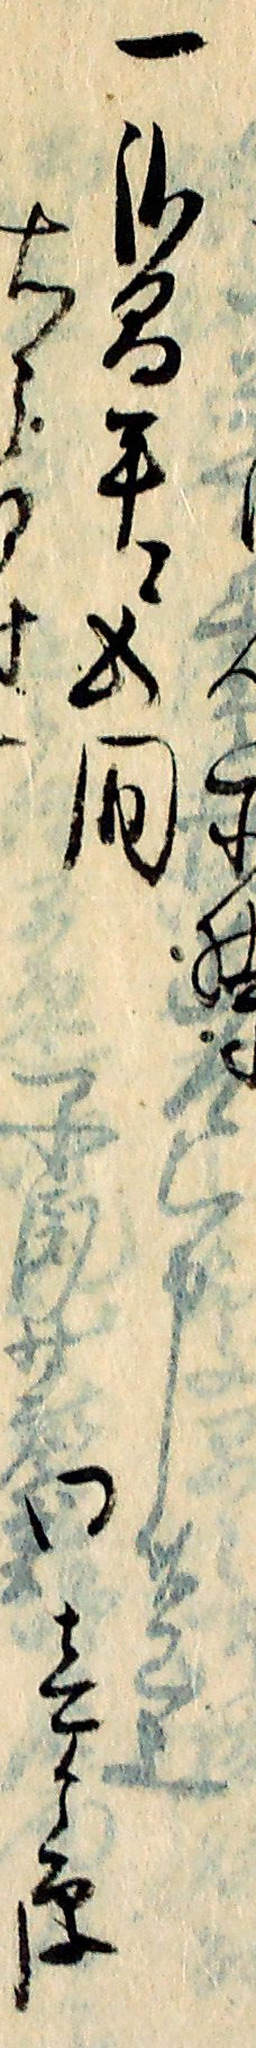一弐間半に六間同壱ヶ所
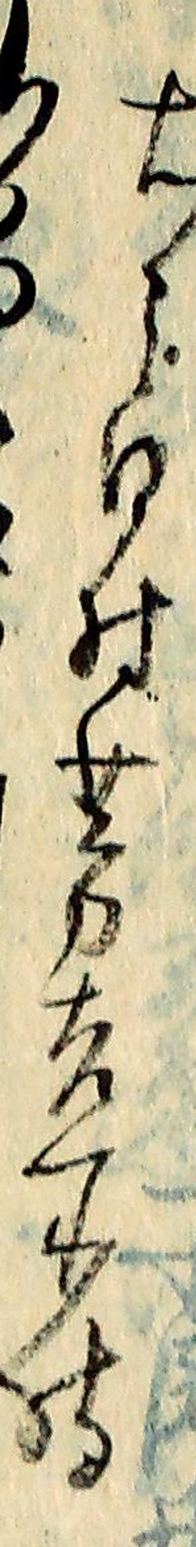右は同村芳吉所持
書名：諸御願書控(後藤氏壱番）
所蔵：鳴門教育大学 Naruto University of Education
